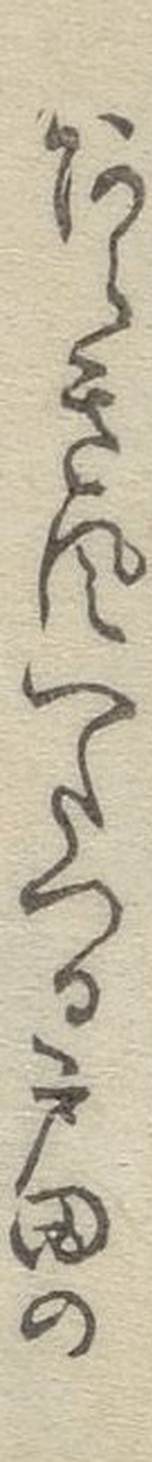あらき風へたつる戸田の
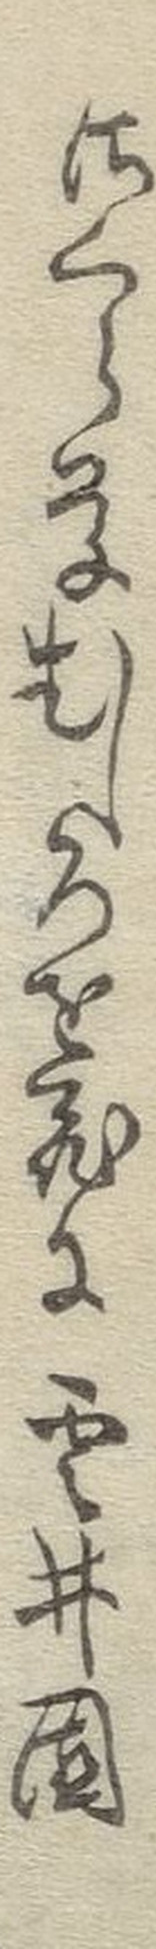さくら草むしろを花に雲井園
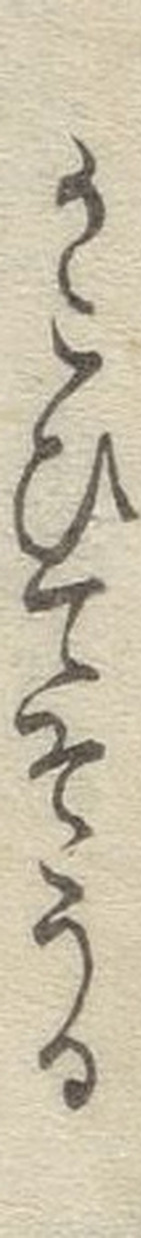かこひてそうる
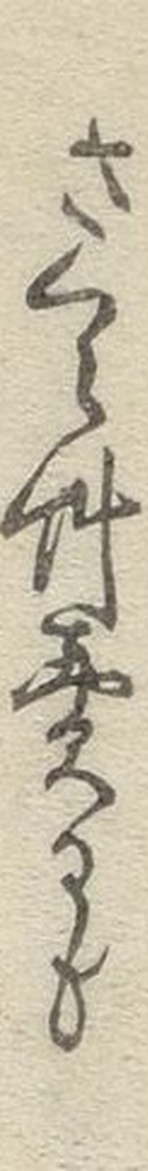さくら草売るも
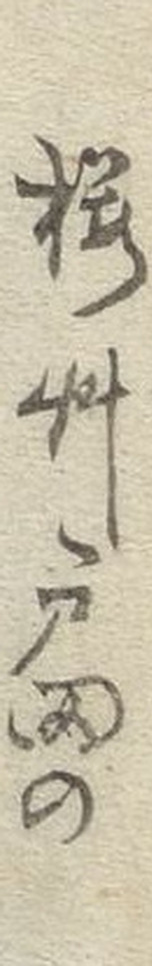桜草戸田の
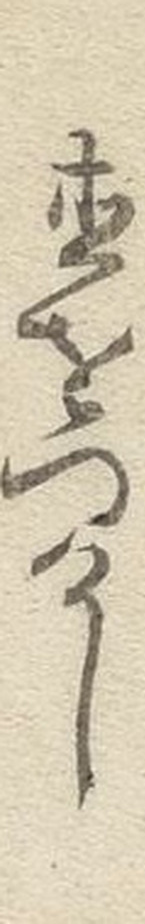直をつけし
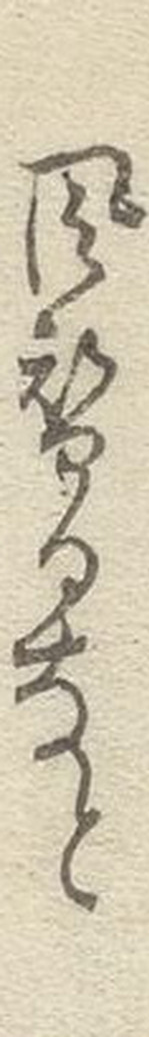風替るなと
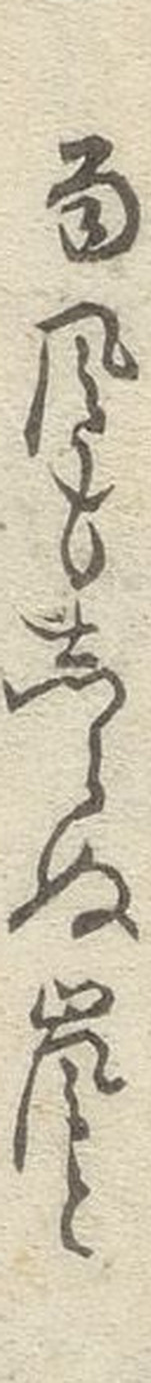雨風もしらぬ嵐と
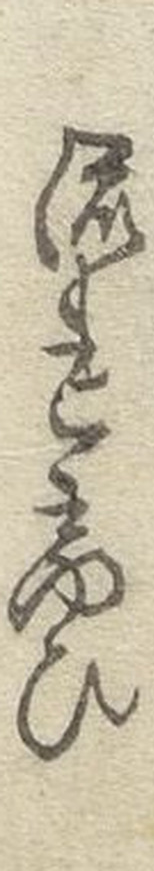流れ商ひ
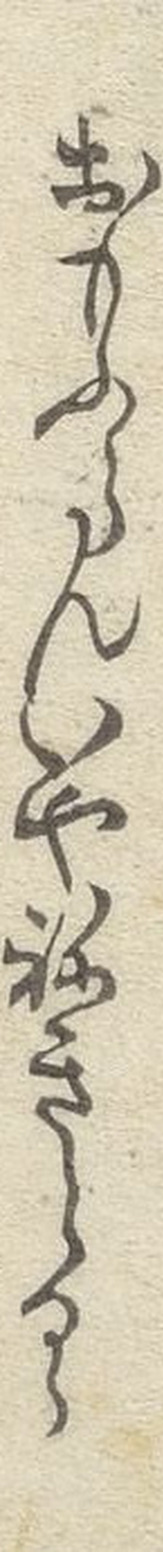おもふらんいやねきらるゝ
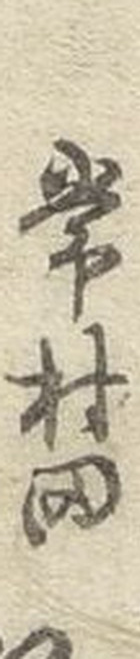常村田
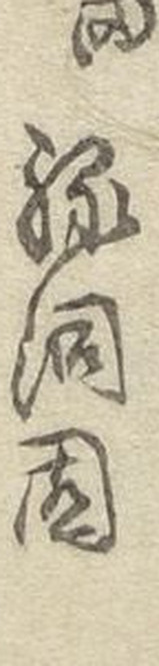緑洞園
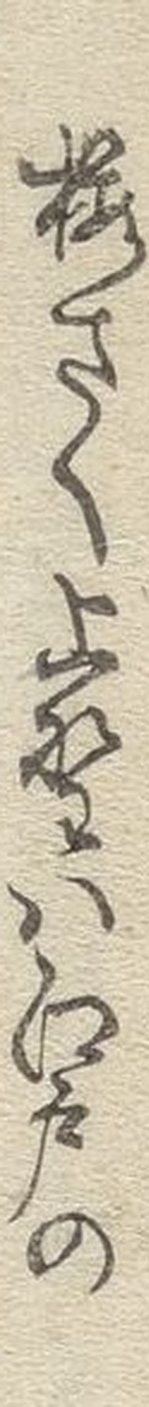桜さく上野は江戸の
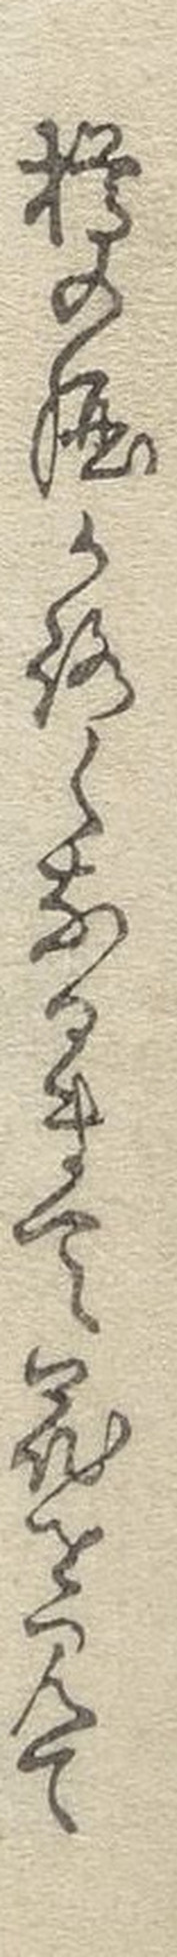樽の酒かろくなるまて花を見て
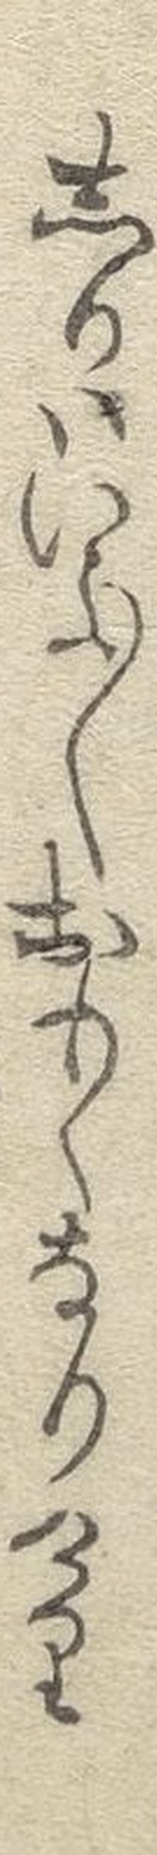しりはいよ〳〵おもくなりけり
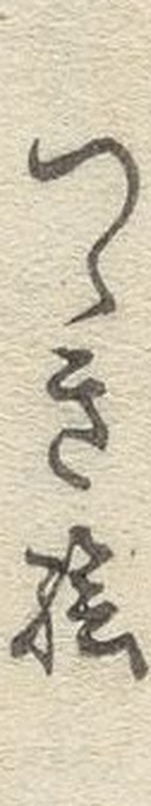つゝき絵
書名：Picture Album of People with Kyōka (Light Verse) (Kyōka shiki jinbutsu 狂歌四季人物)
